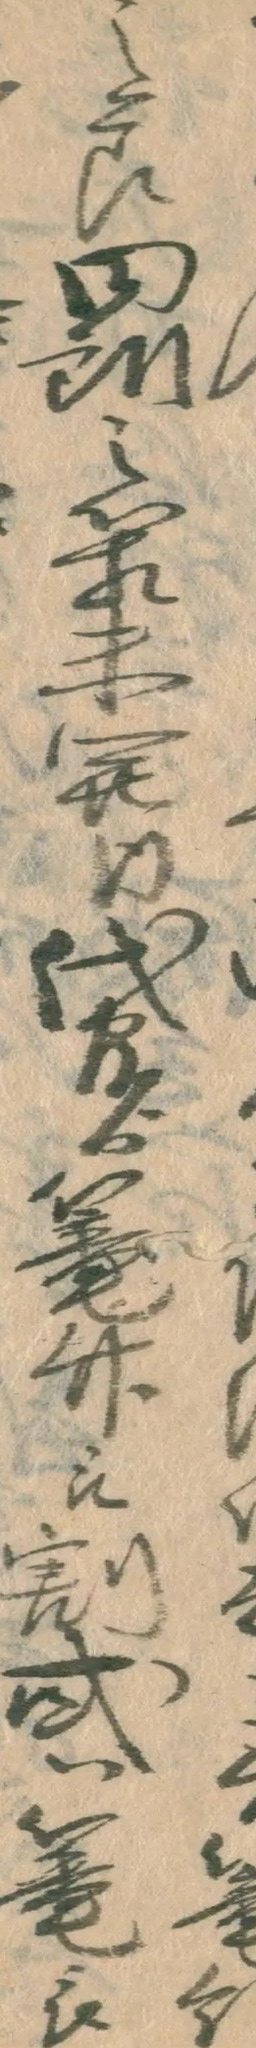之節田所之箱未開由代官ゟ篭竹被割或ハ篭被
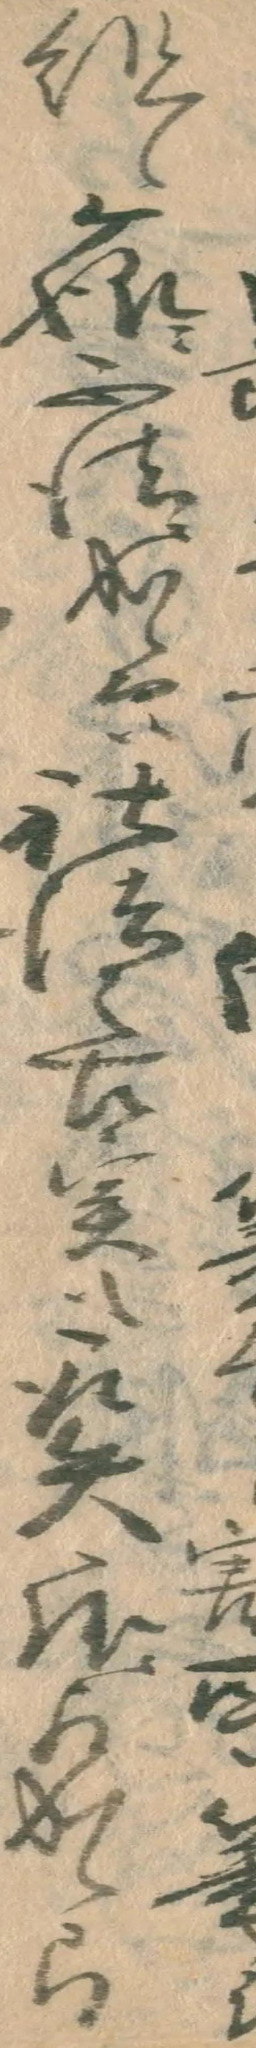組候ケ様ニ不法ニ成候而ハ社法之古実も取失候様ニ相成候間
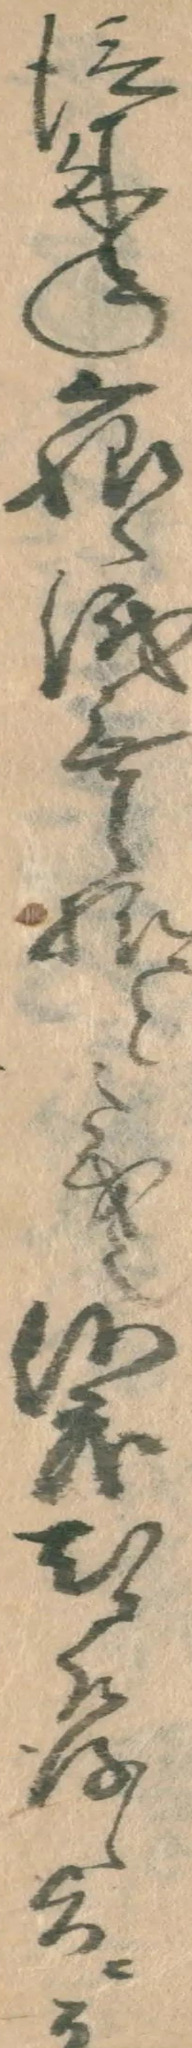従来年ケ様之儀無之様ニと之義也何も尤ニ被存候旨ニ而

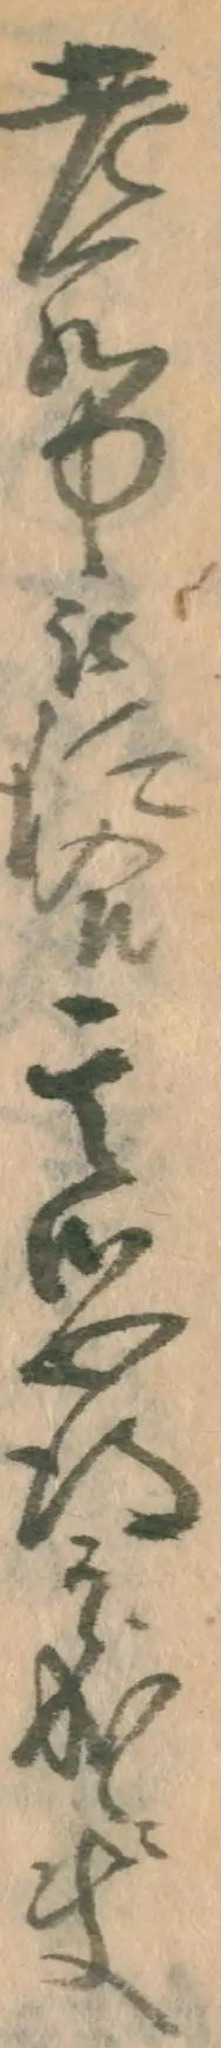老若中被仰合其御心得可被成ニ決
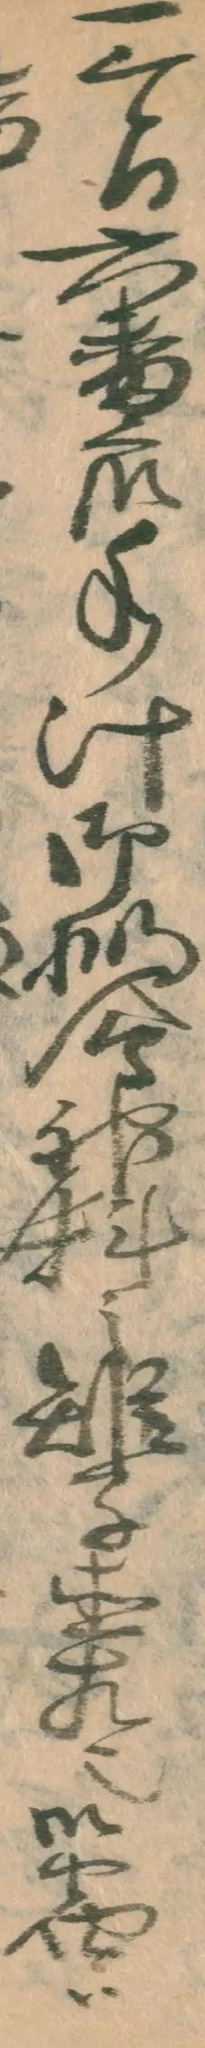一今日六番衆手汁御棚会神料之雉子直相也御宿ハ
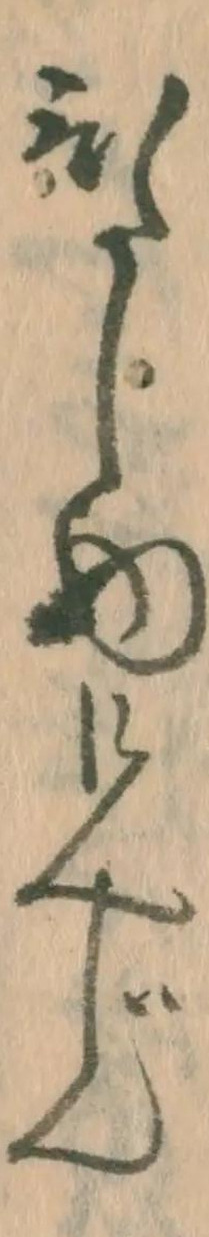ひたし物にんじん飯
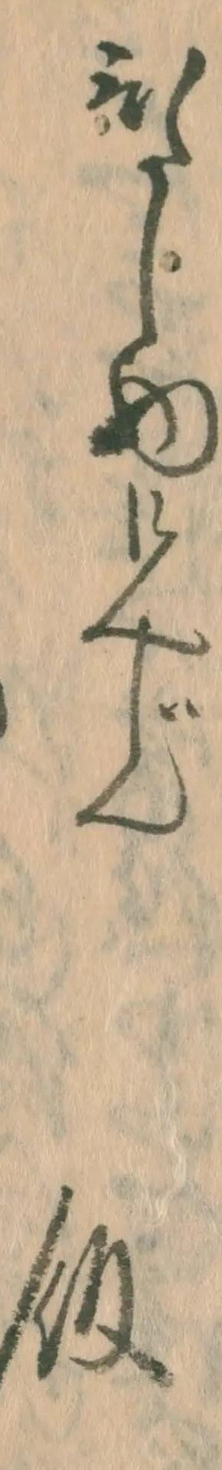ひたし物にんじん飯
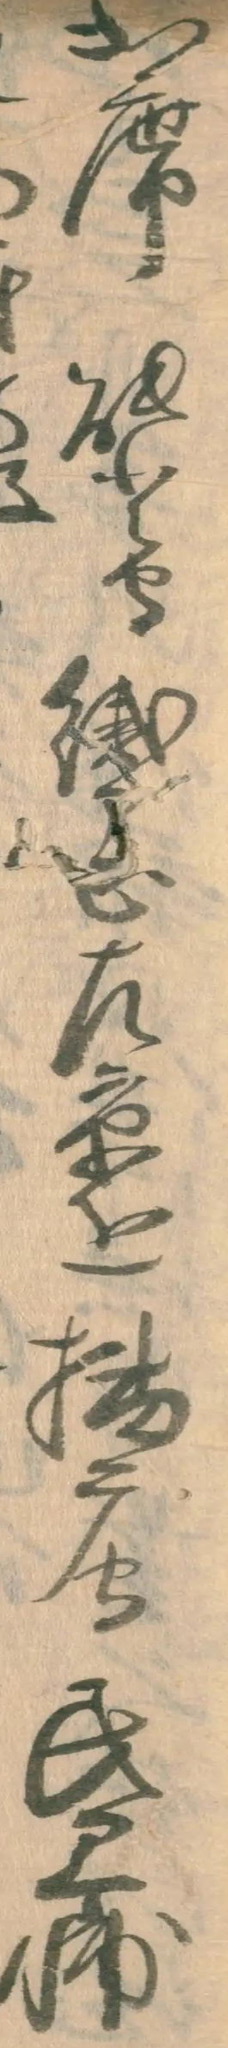出席能登守織部正左京進播磨守民部少輔
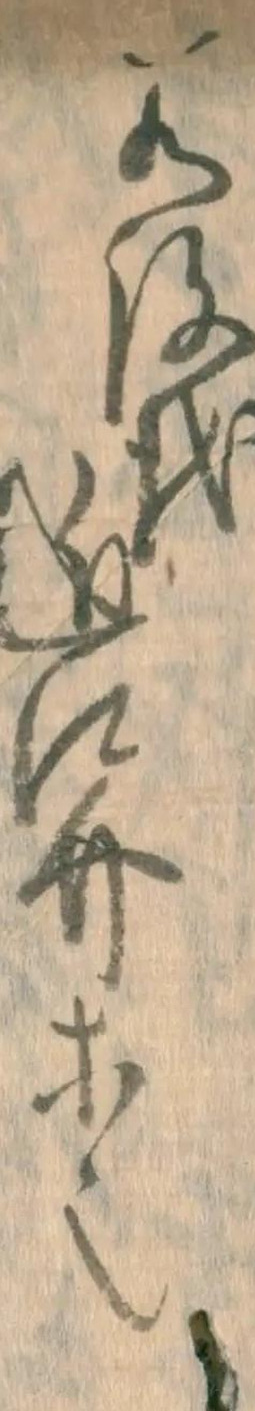近江介等也
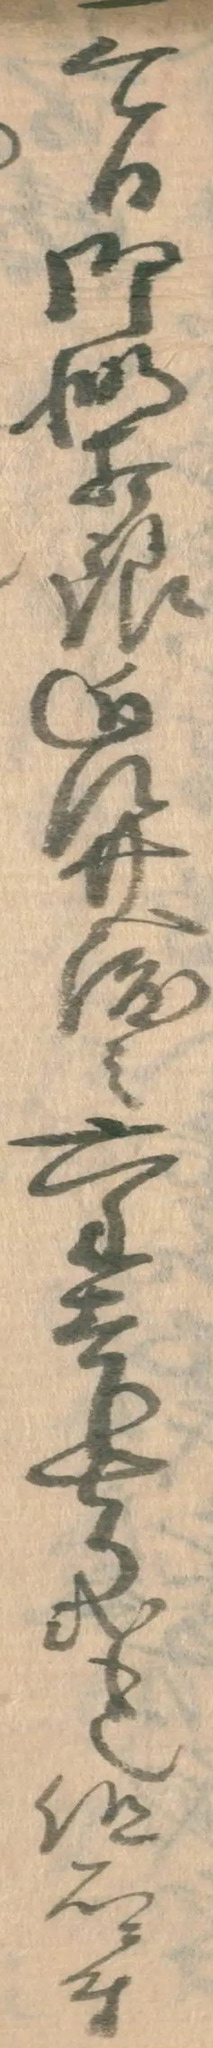一今日御棚打銀近江介へ渡之六匁壱歩七厘弐毛也但右ニ付
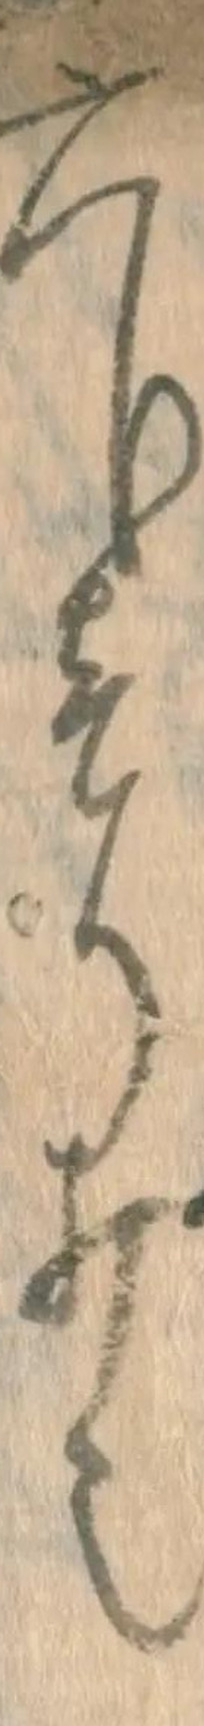六歩壱厘打也
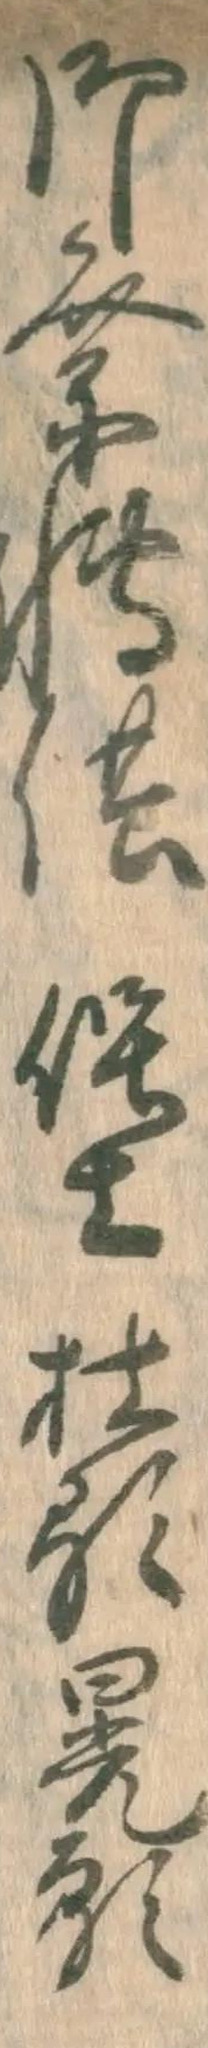御祭転供保士杜顕晃顕
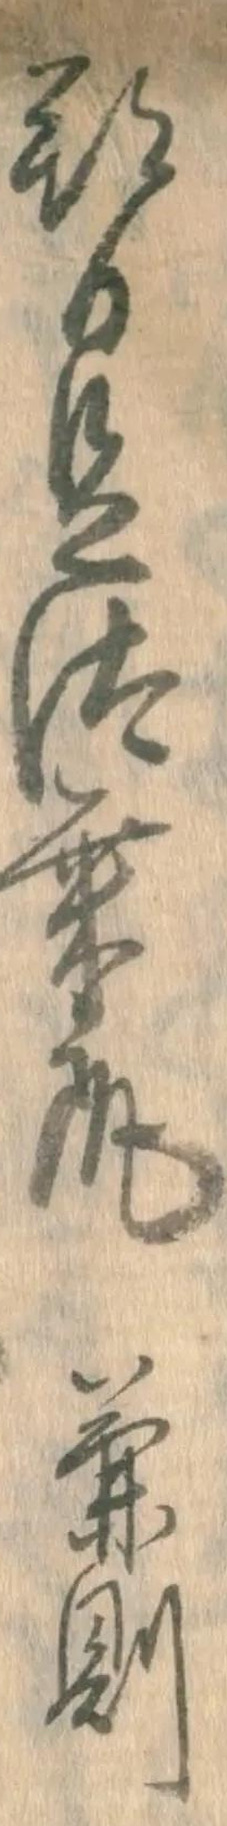朔日足汰乗尻兼則
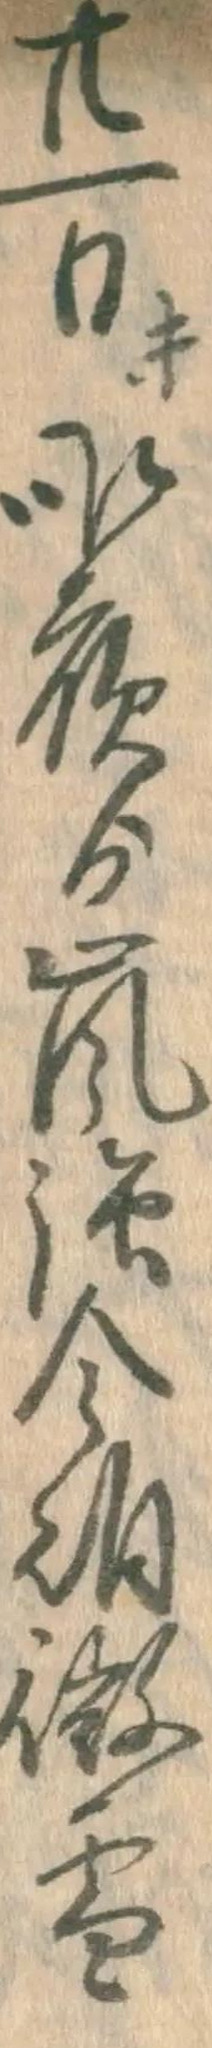廿一日未昨夜ゟ嵐強今明微雪
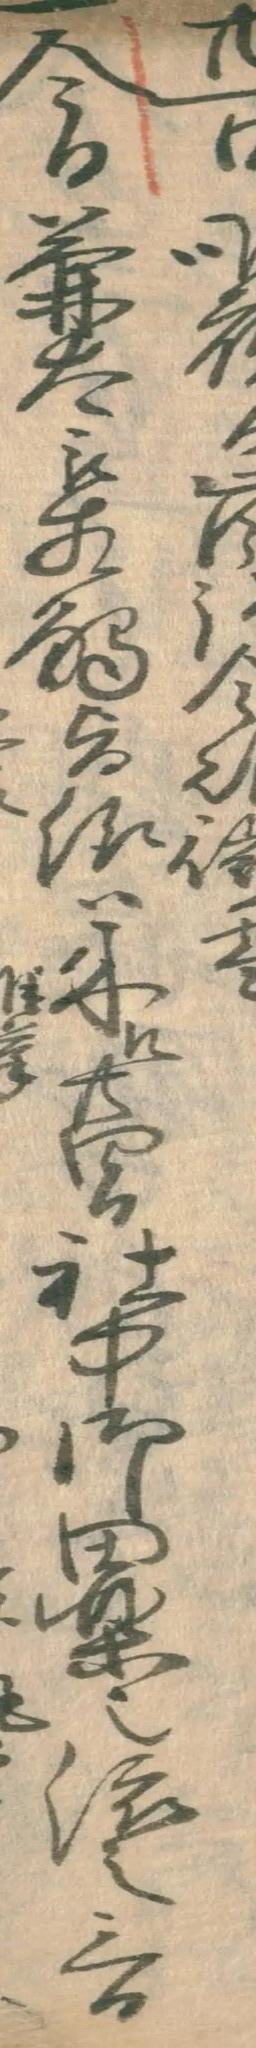一今日兼太被相触旨趣ハ来ル廿四日社中御田楽也依之三日
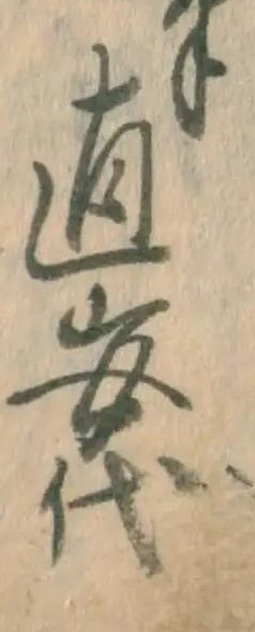直安代
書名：賀茂社記録. 第60冊
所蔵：国立国会図書館 National Diet Library, JAPAN
